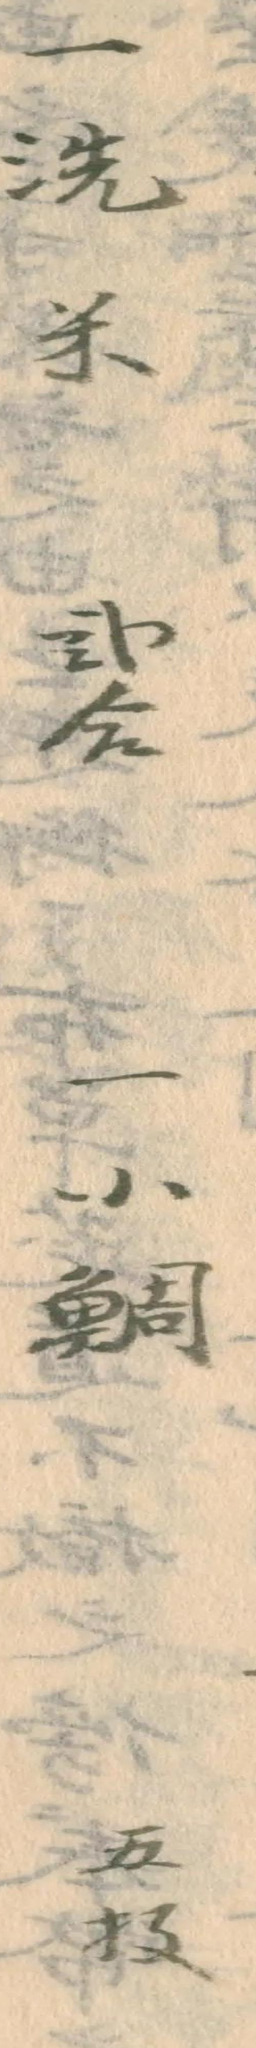一洗米弐合一小鯛五枚
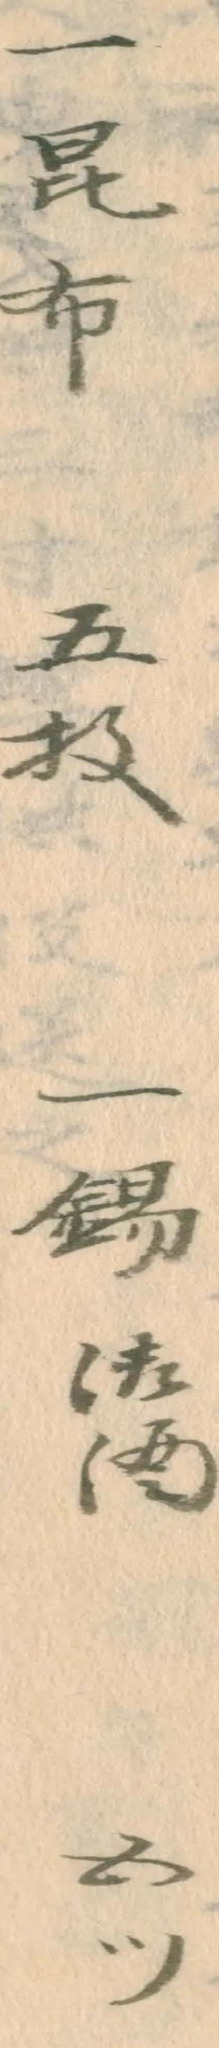一昆布五枚一鯣御酒五ツ
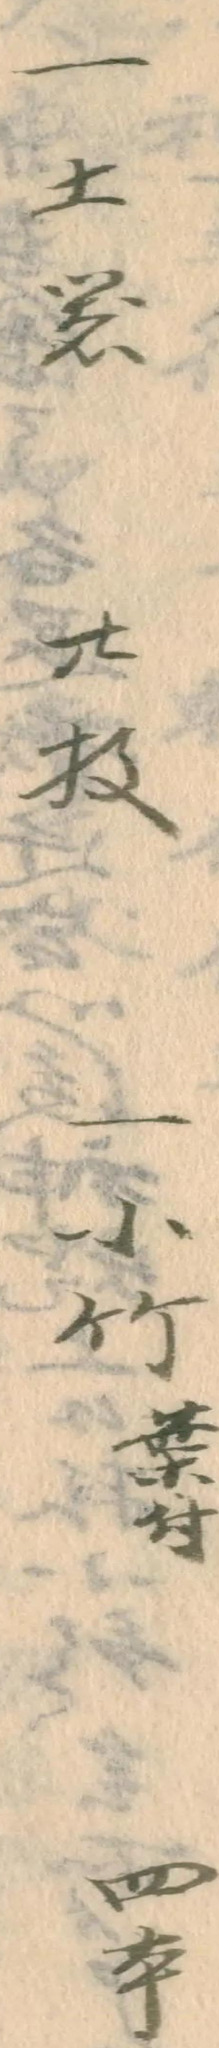一土器廿枚一小竹葉付四本
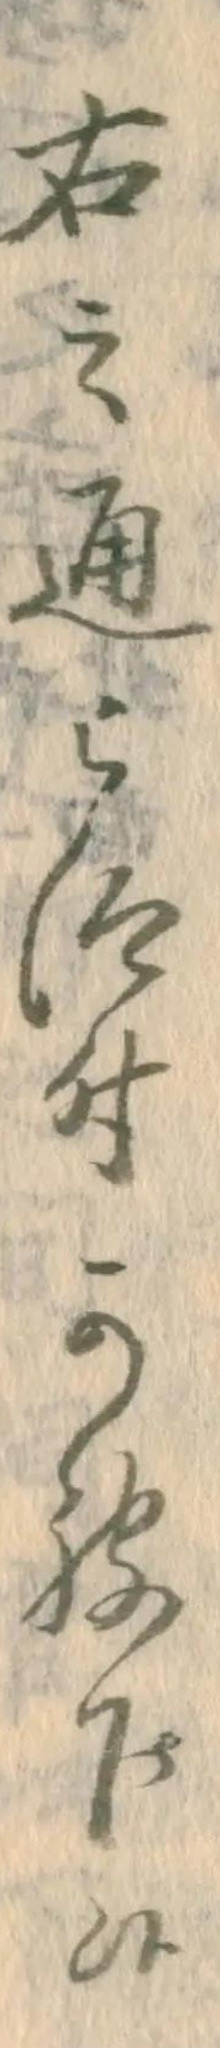右之通被仰付可被下候
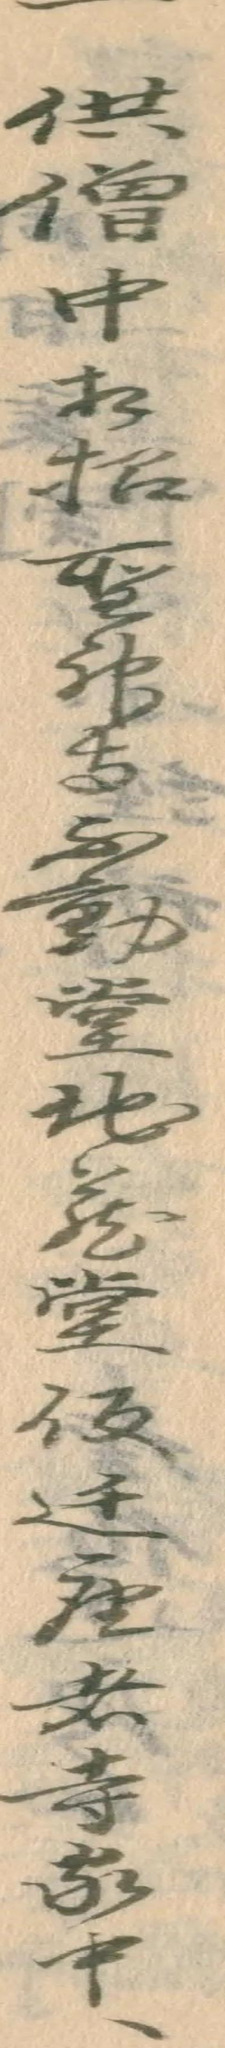一供僧中相招聖神寺不動堂地蔵堂仮迁座は寺家中へ
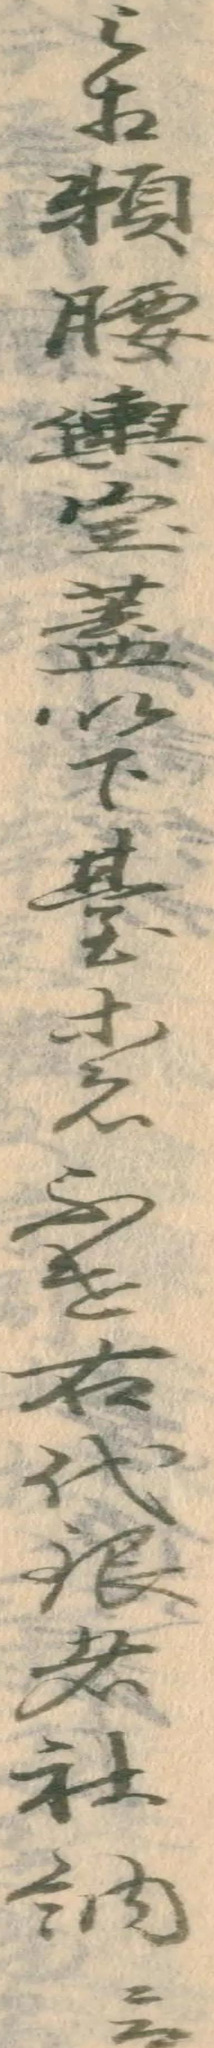被相頼腰輿宝蓋以下台等は不遣右代銀者社納ニ而
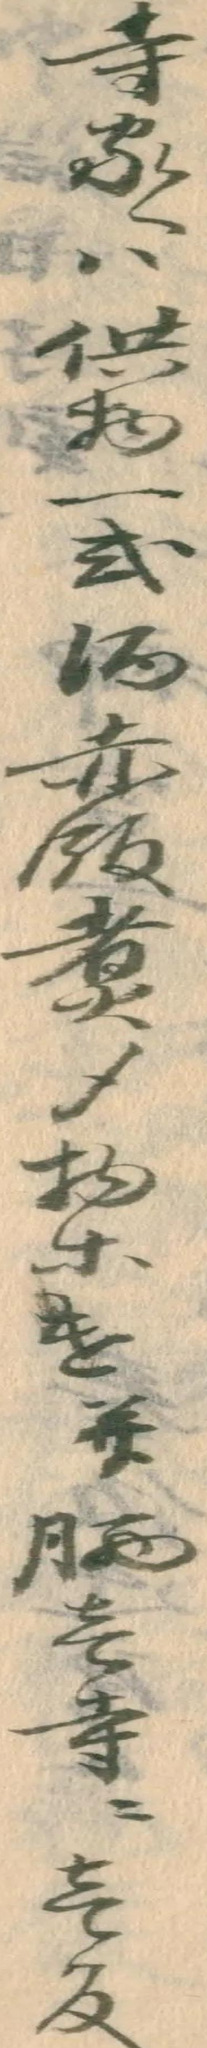寺家ヘハ供物一式酒赤飯煮〆物等遣并晒壱寺ニ壱反
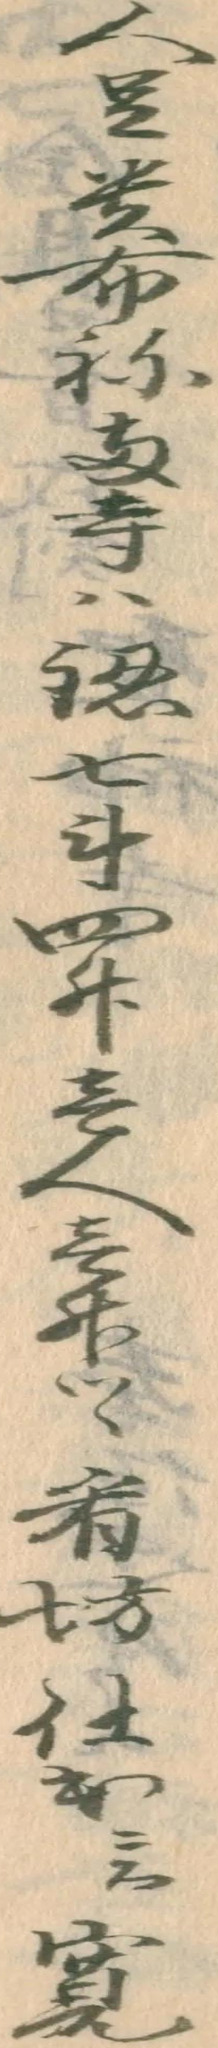人足貴布祢両寺ハ認七斗四升壱人壱升ツヽ看坊仕出ニ而寛
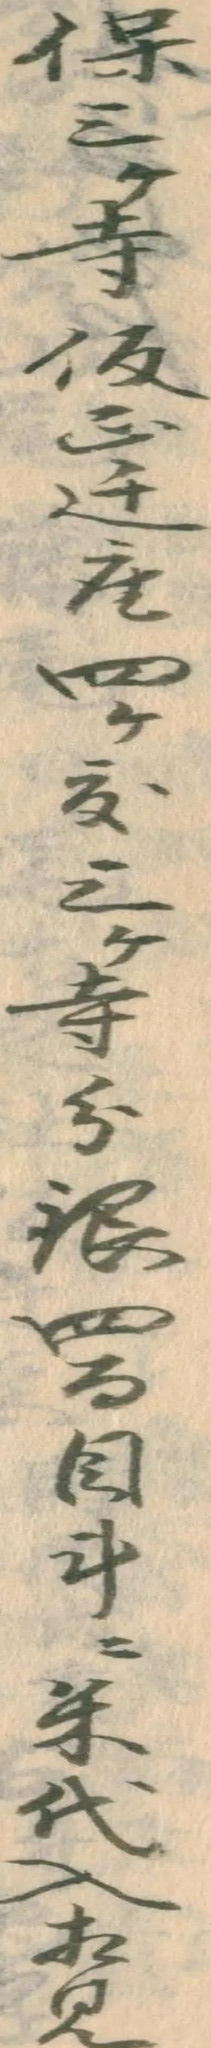保三ヶ寺仮正迁座四ヶ度三ヶ寺分銀四百目計ニ米代入相見
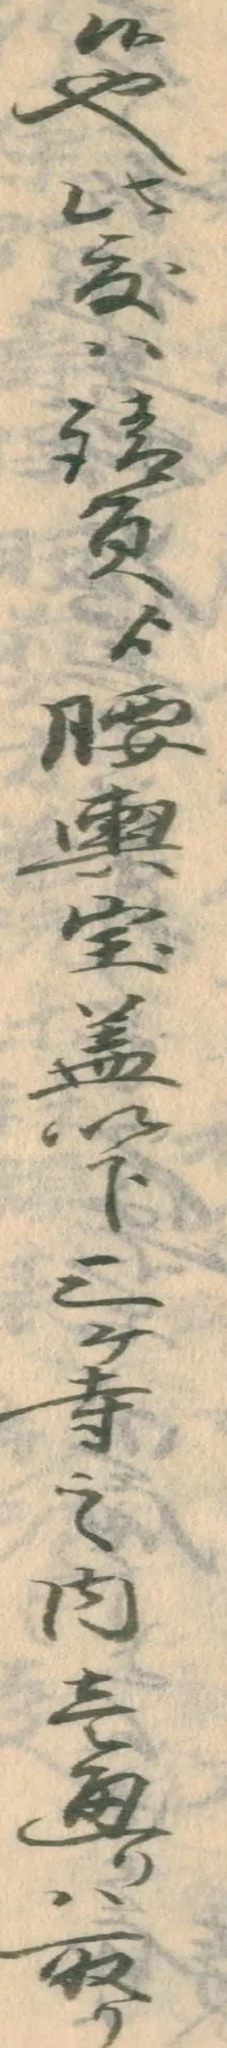候也此度ハ請負ゟ腰輿宝蓋以下三ヶ寺之内壱通リハ取り
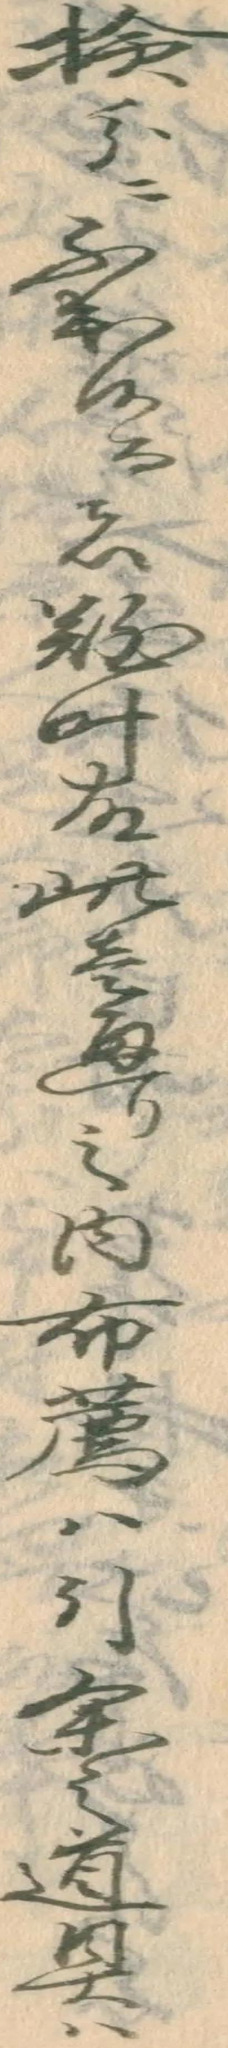検分ニ不出候而は難叶故此壱通り之内布薦ハ引余之道具ハ
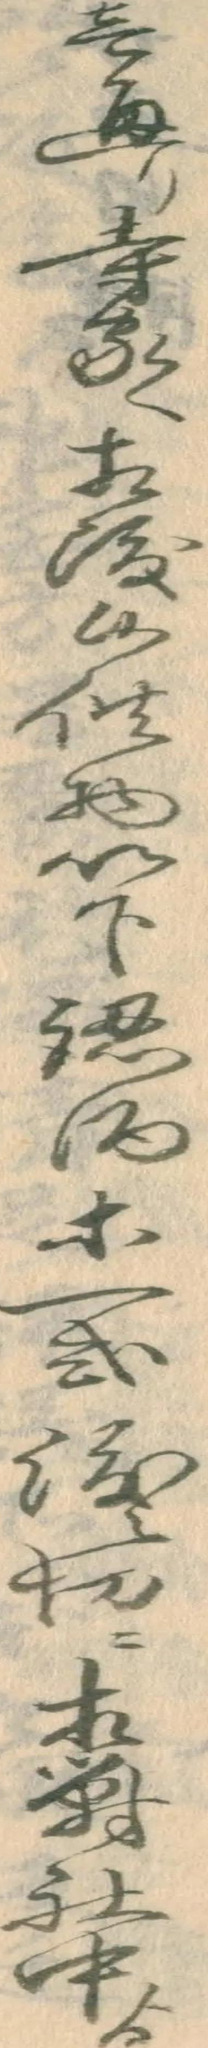壱通り寺家へ相渡候供物以下認酒等一式儀候切ニ相対社中ゟ
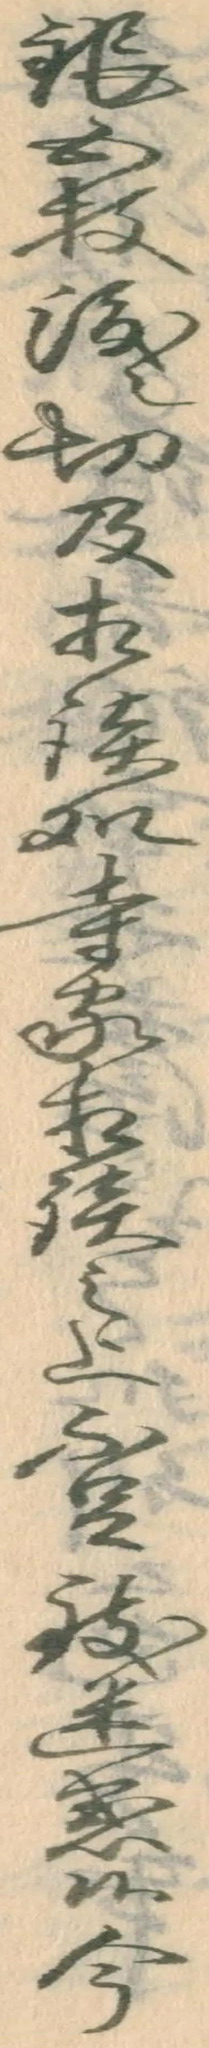銀五枚渡シ切及相談処寺家相談之上不足致迷惑候今
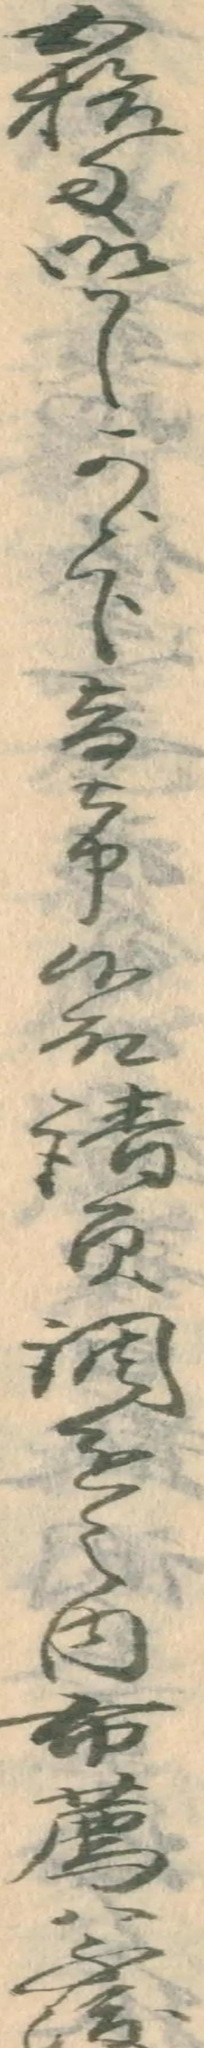五拾匁御かし可被下旨被申候故請負調進之内布薦ハ不渡
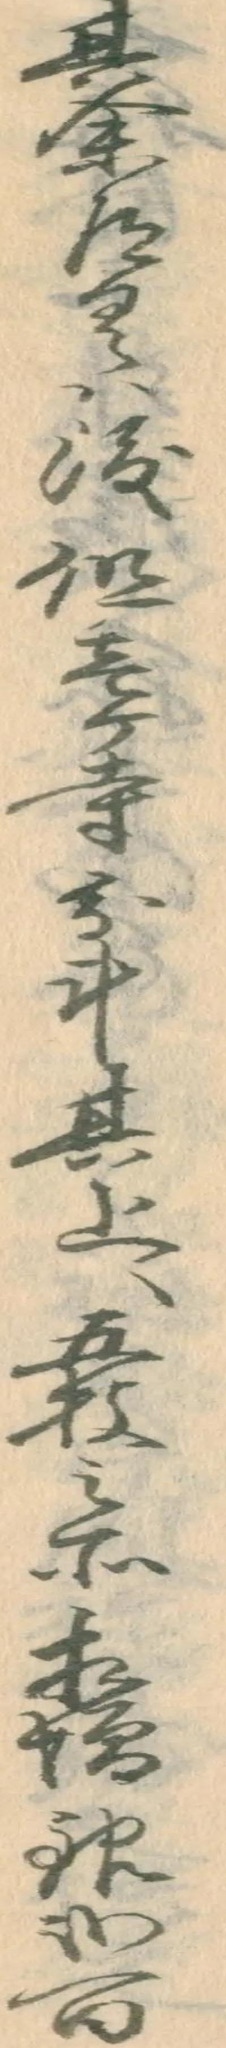其余道具ハ渡但壱ケ寺分計其上へ五枚之所相増銀弐百

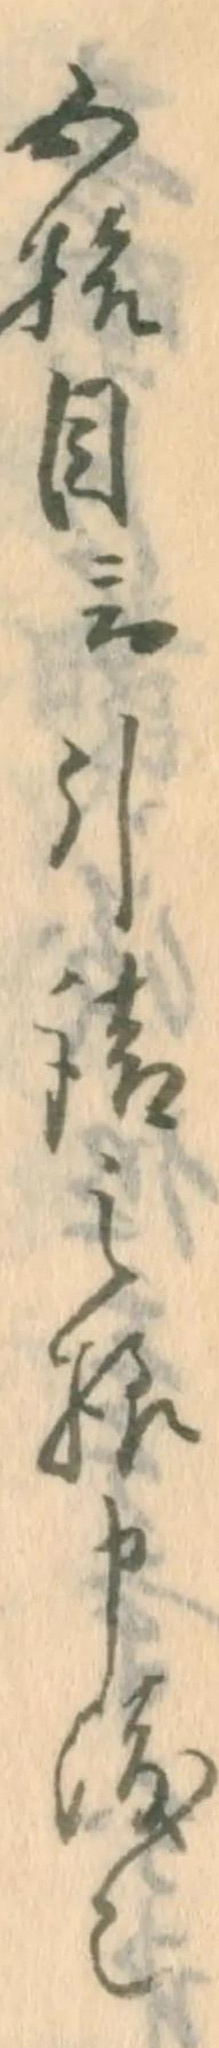五拾目ニ而引請之様申渡之
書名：賀茂社記録. 第17冊
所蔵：国立国会図書館 National Diet Library, JAPAN
